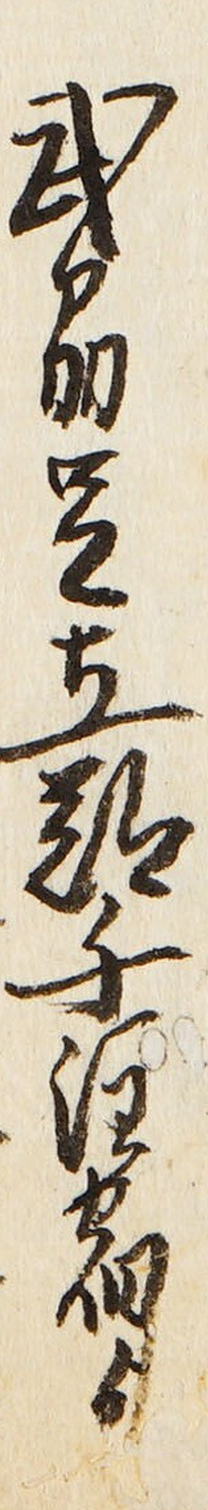武州足立郡千住宿ゟ
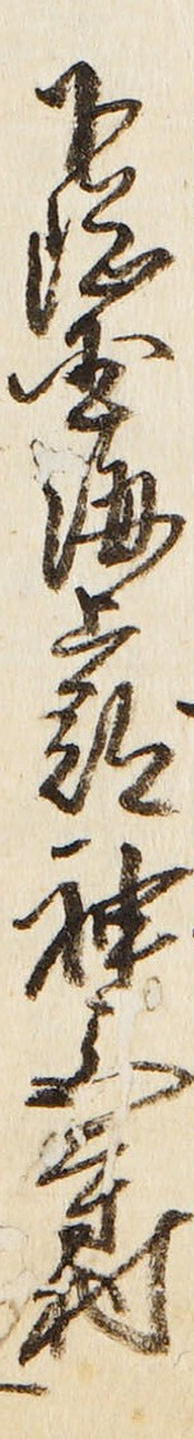下総国海上郡神宮寺村迄
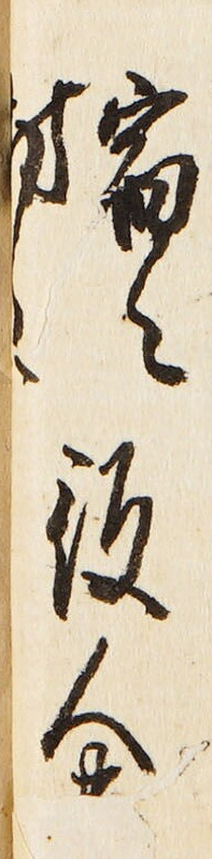村々役人江
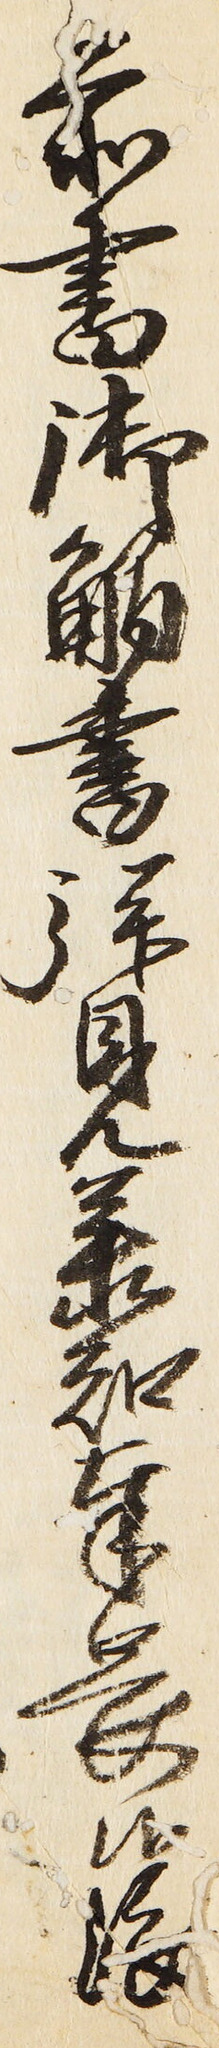前書御触書拝見承知奉畏候依
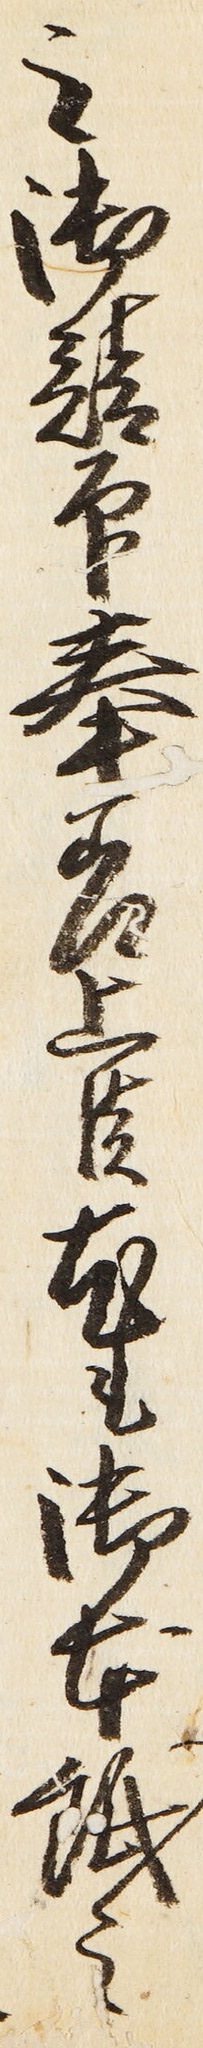之御請印奉差上候尤も御本紙之
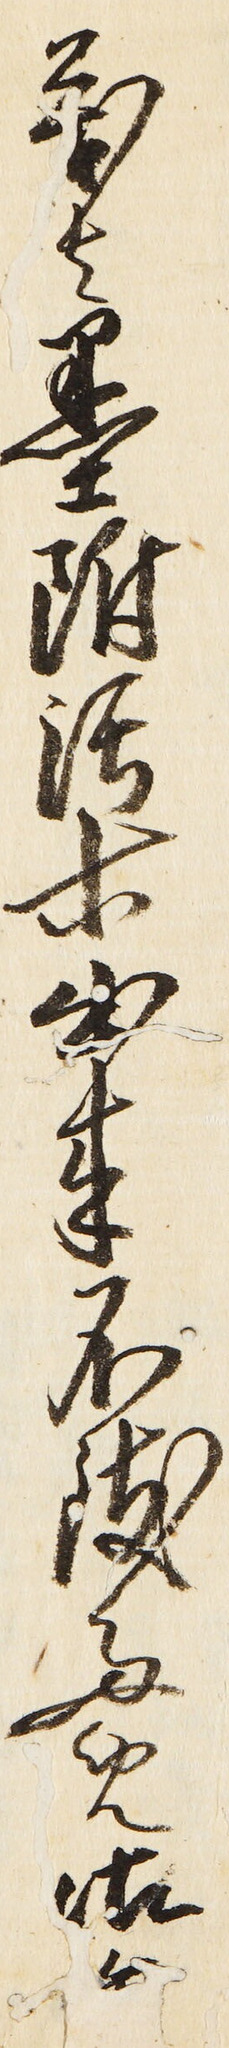義者墨付汚等出来不致ため御文
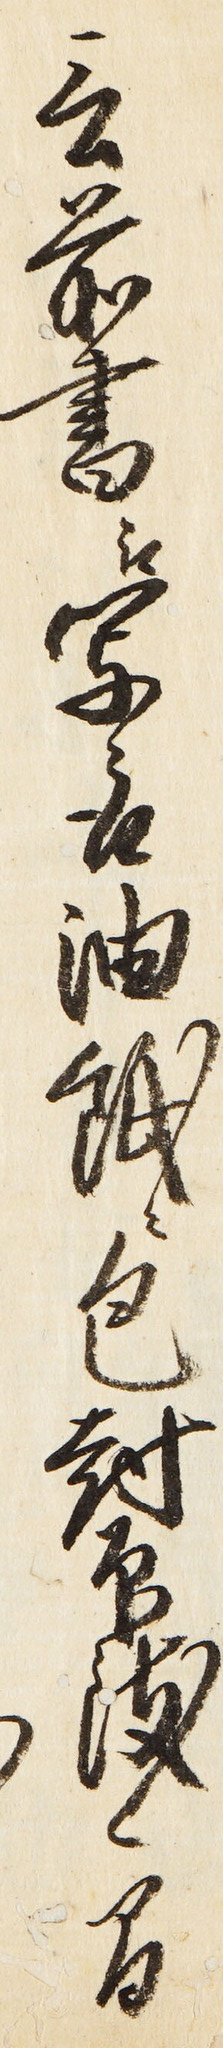言前書江写取油紙ニ包封印致候間
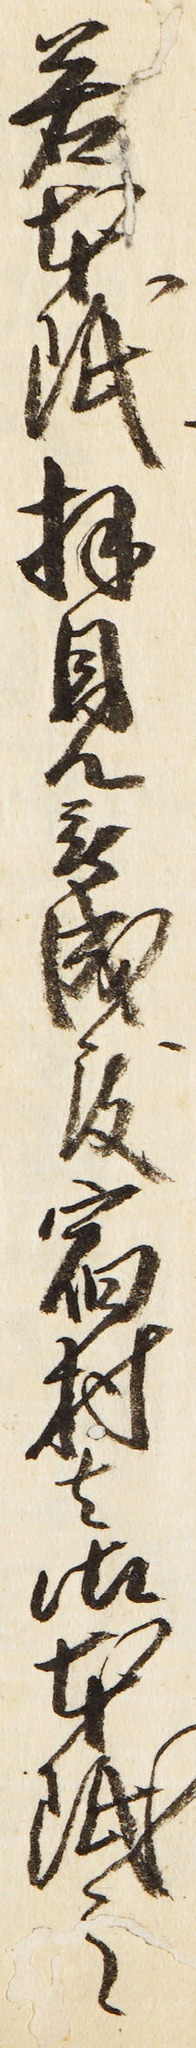若本紙拝見被成度宿村者本紙之
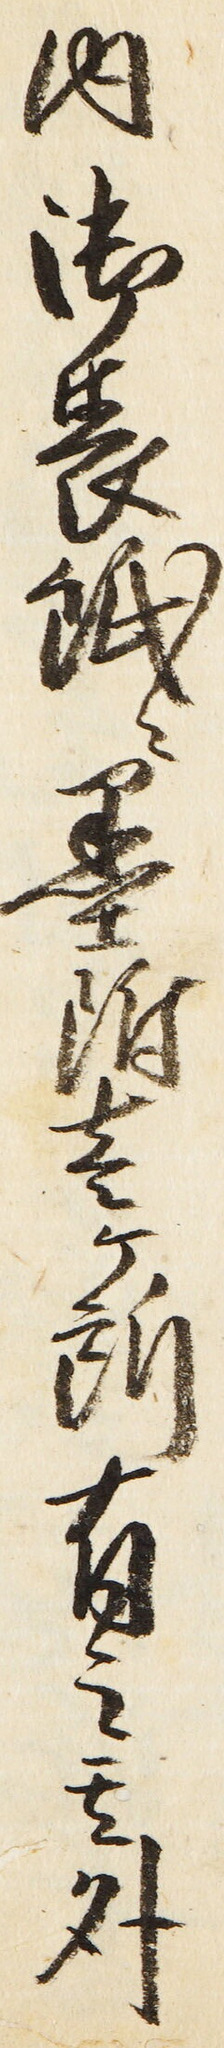内御表紙ニ墨付壱ケ所有之其外
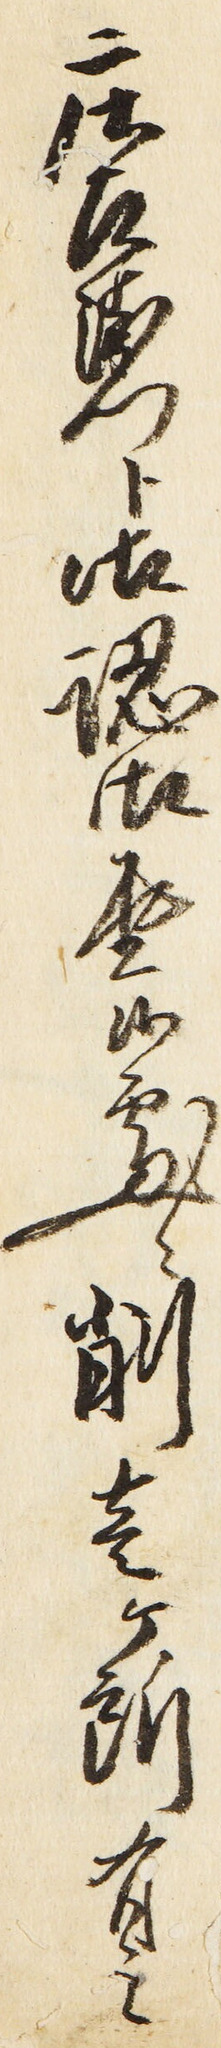庄左衛門ト御認御座候処ニ削壱ケ所有之

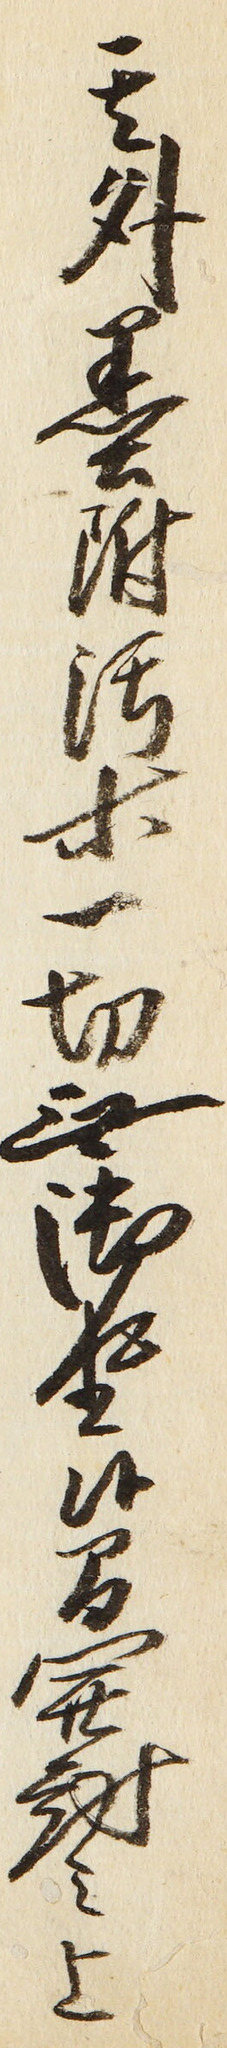其外墨付汚等一切無御座候間開封之上
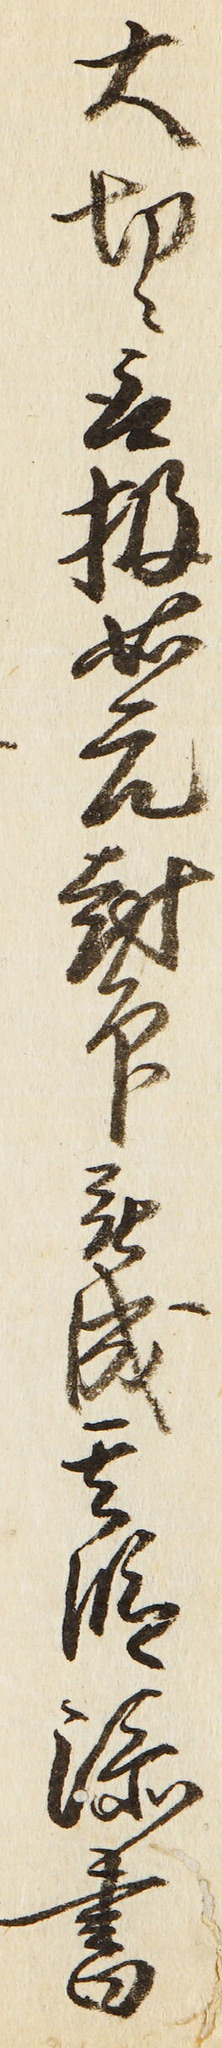大切ニ取扱如元封印被成其段添書
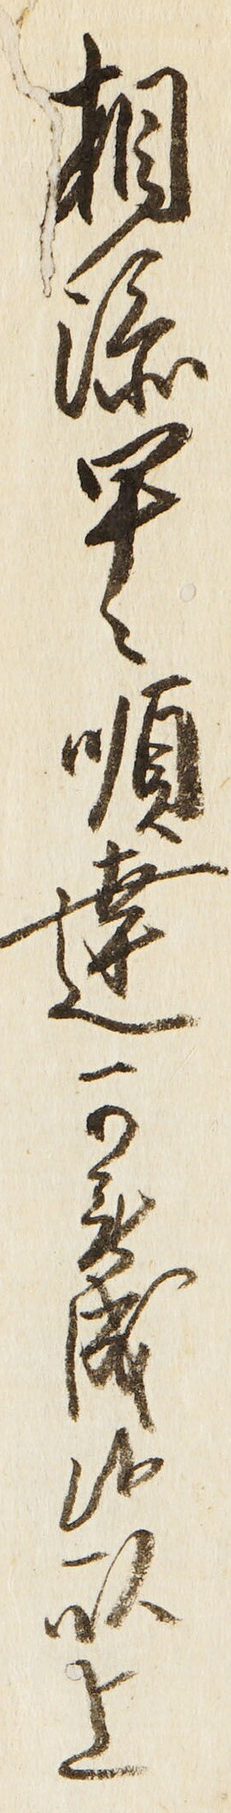相添早々順達可被成候以上
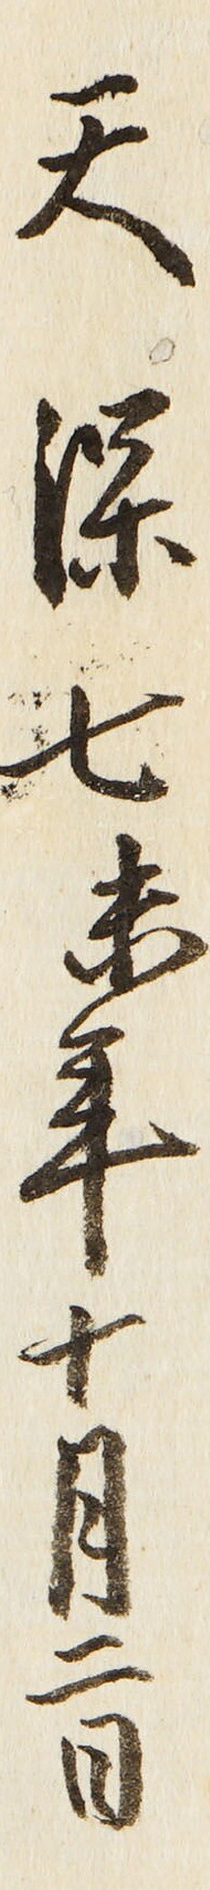天保七未年十月二日
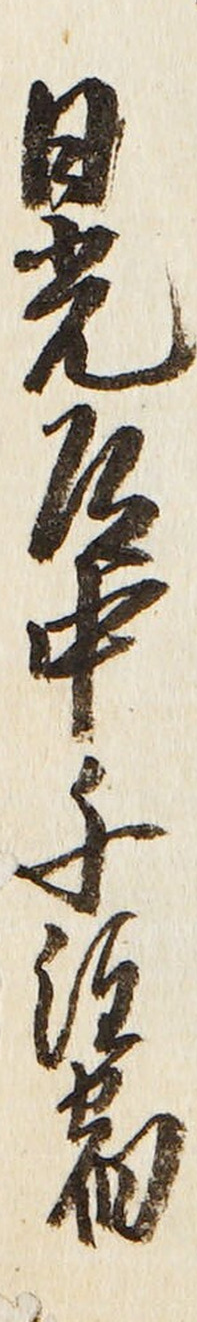日光道中千住宿
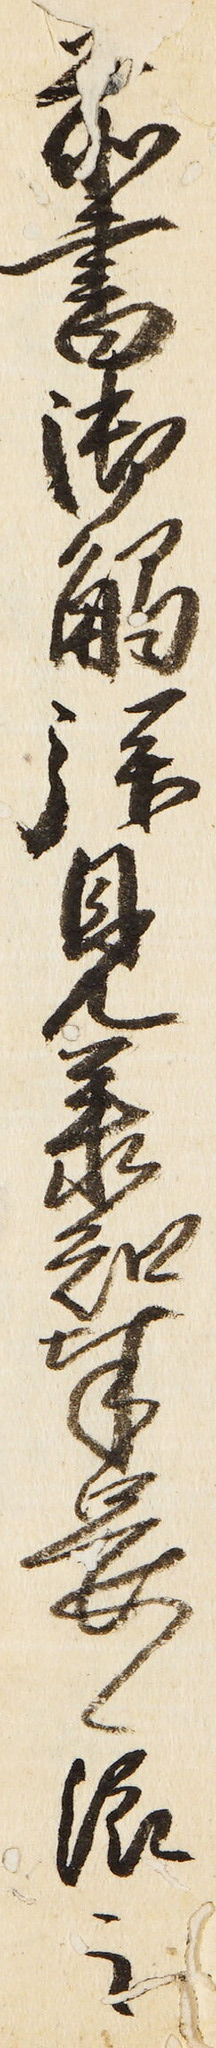前書御触拝見承知奉畏候依之
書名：難船一件記録
